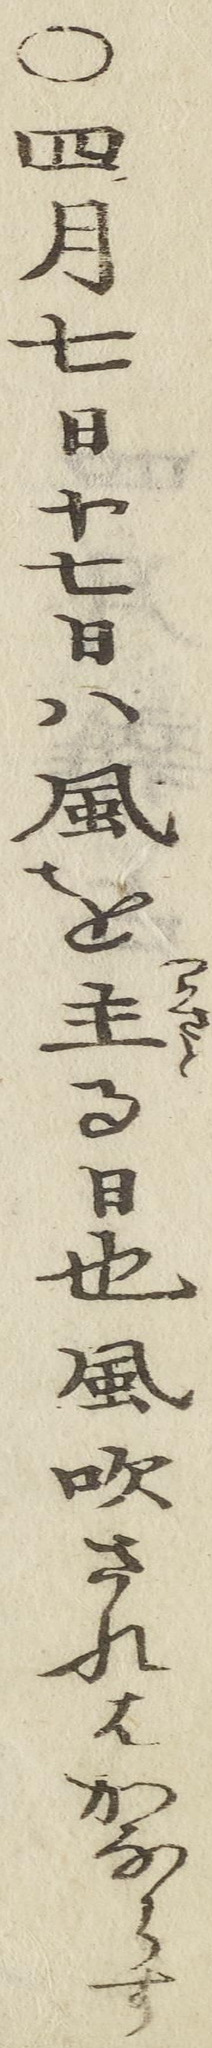○四月七日十七日は風を主る日也風吹されはかならす
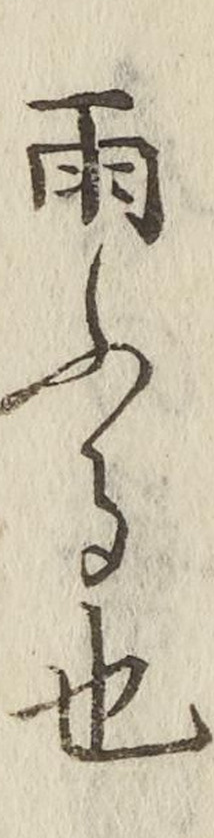雨ふる也
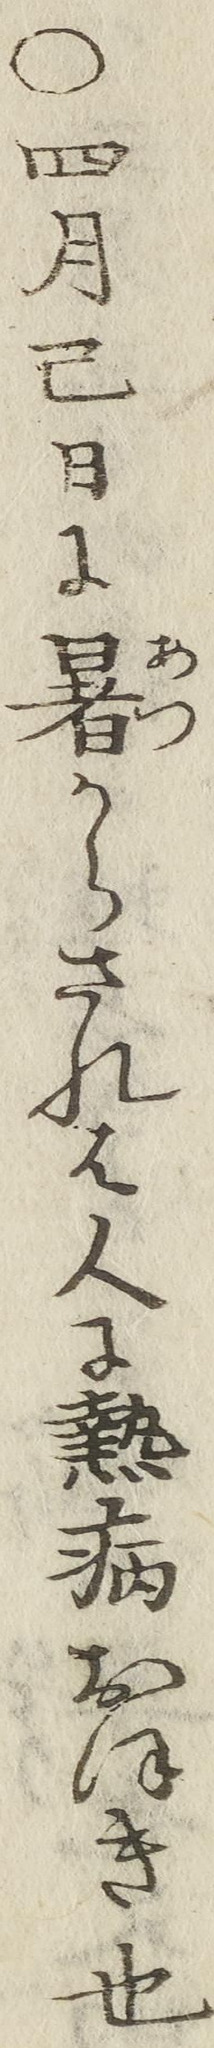○四月己日に暑からされは人に熱病おほき也
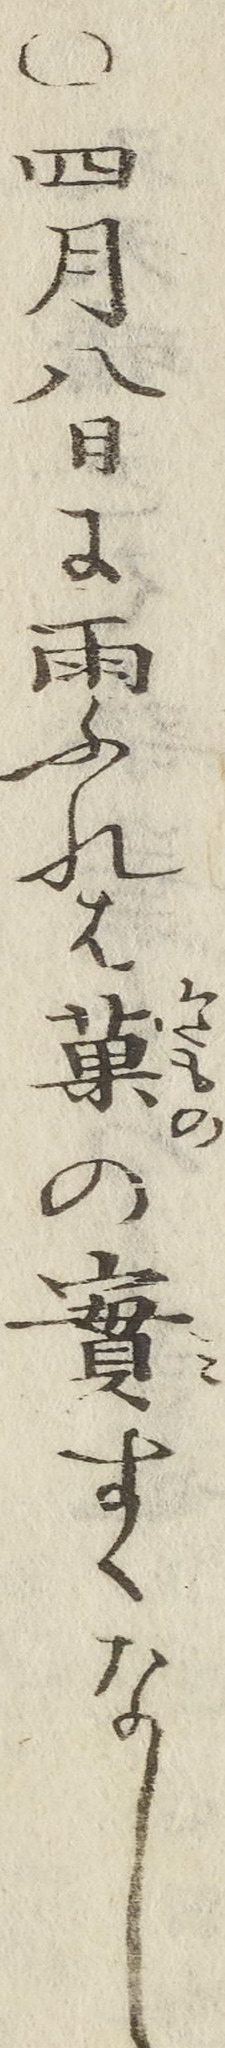○四月八日に雨ふれは菓の実すくなし
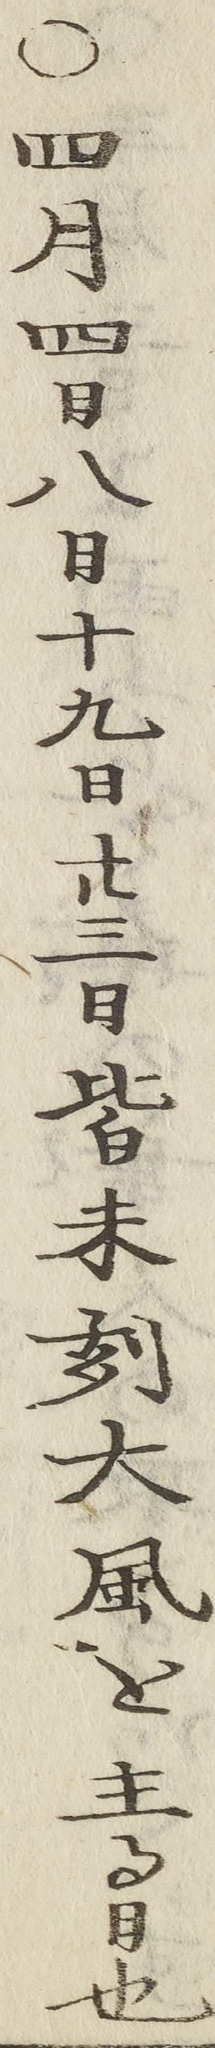○四月四日八日十九日廿三日皆未刻大風を主る日也
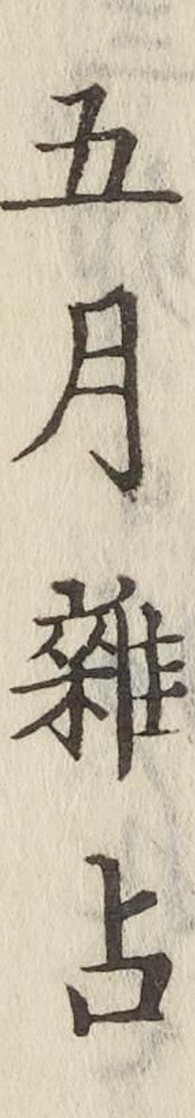五月雑占
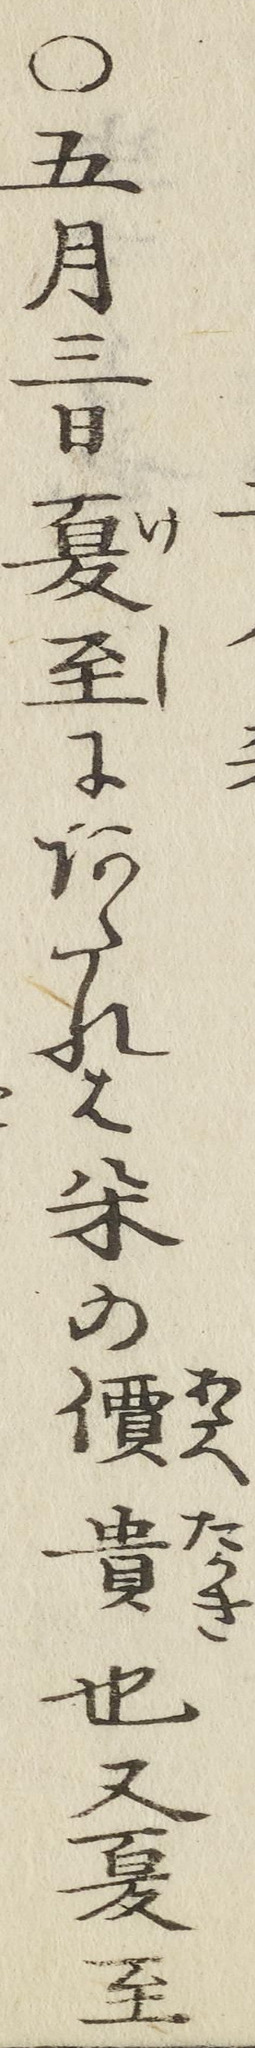○五月三日夏至にあたれは米の価貴也又夏至
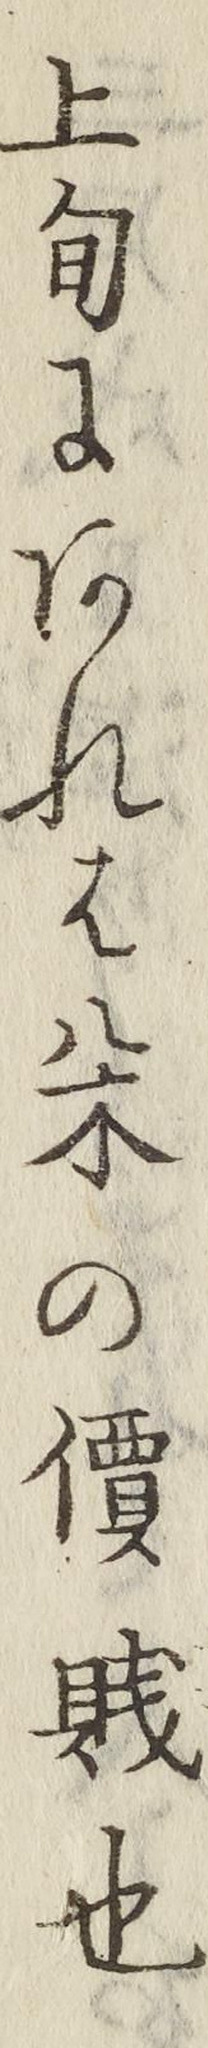上旬にあれは米の価賤也
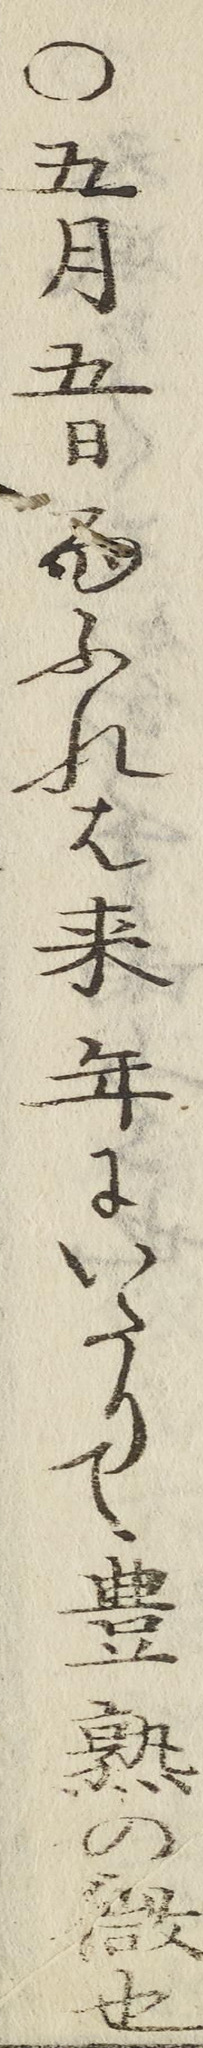○五月五日雨ふれば来年にいたりて豊熟の徴也
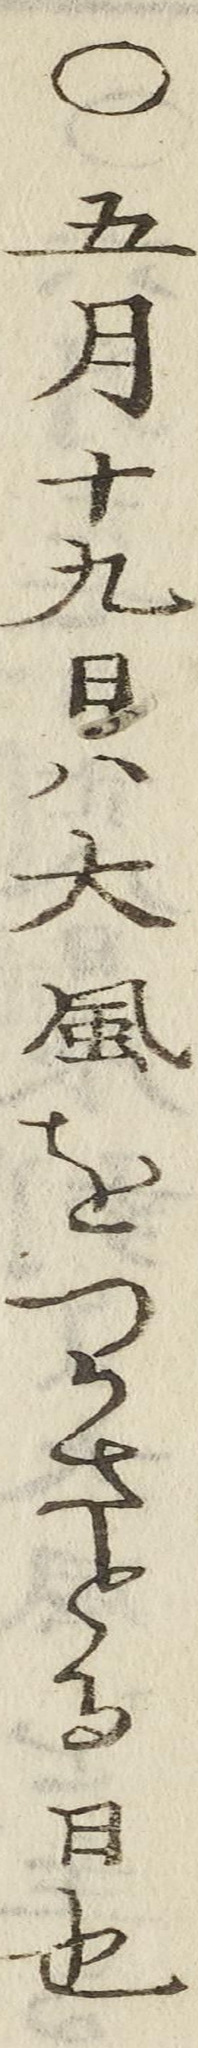○五月十九日は大風をつかさとる日也
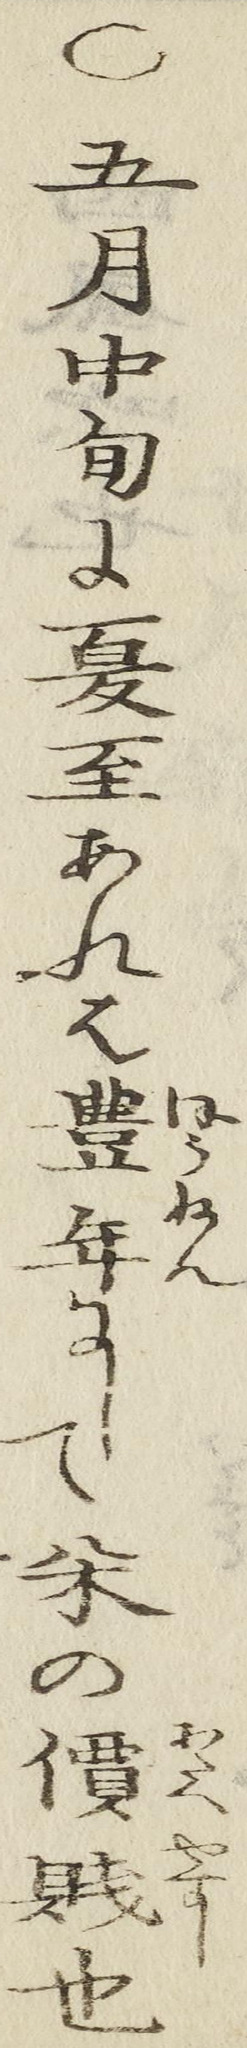○五月中旬に夏至あれは豊年にして米の価賤也
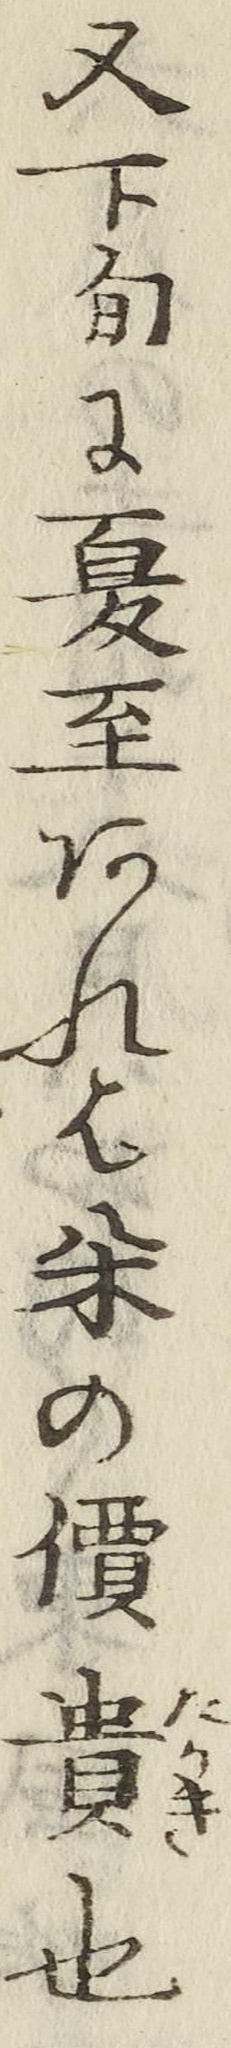又下旬に夏至あれは米の価貴也
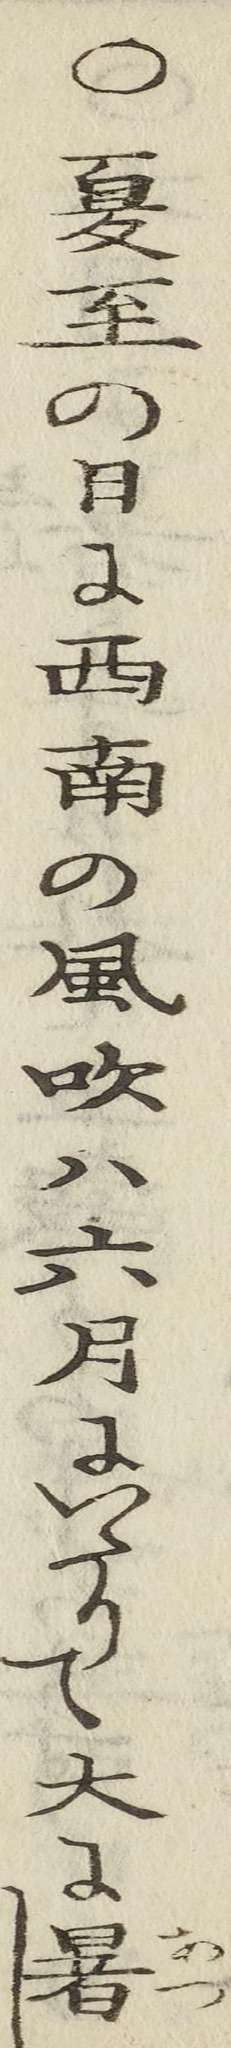○夏至の日に西南の風吹は六月にいたりて大に暑し
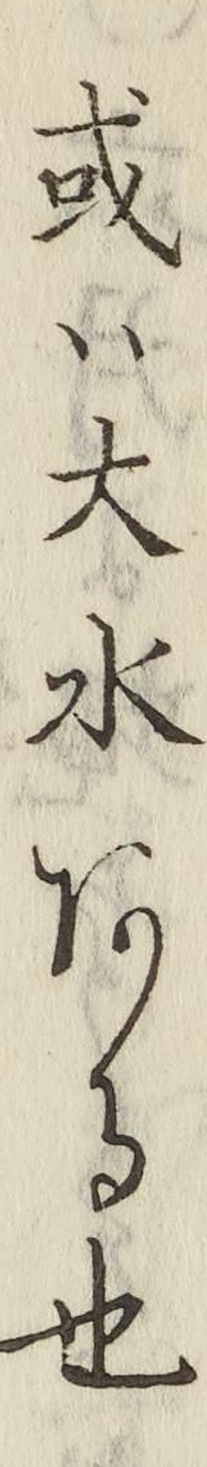或は大水ある也
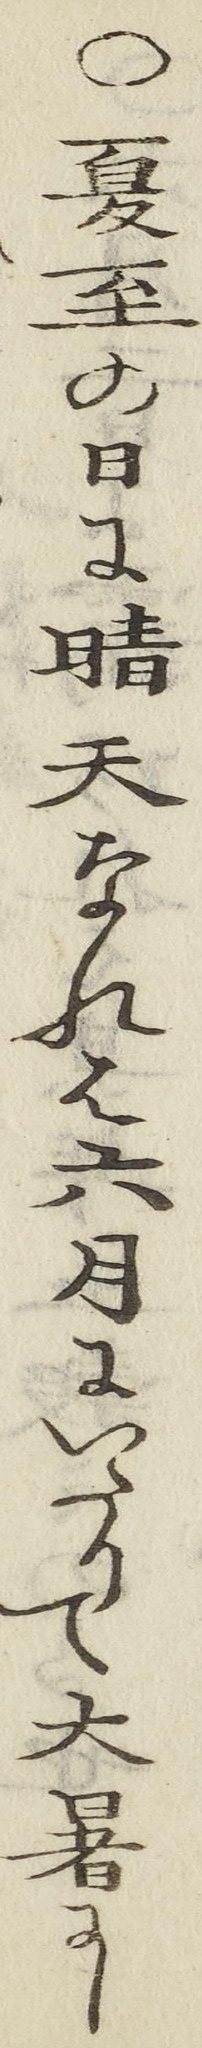○夏至の日に晴天なれは六月にいたりて大暑にし
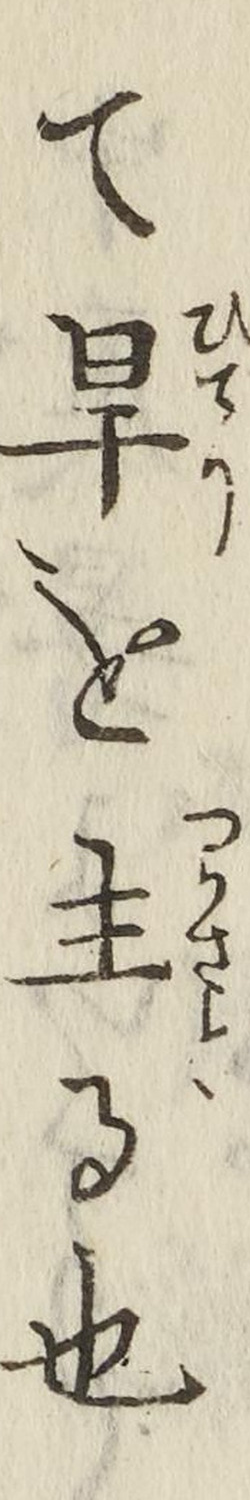て旱を主る也
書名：天時占候　二
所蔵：東京大学地震研究所図書室 Earthquake Research Institute Library, The University of Tokyo, JAPAN
